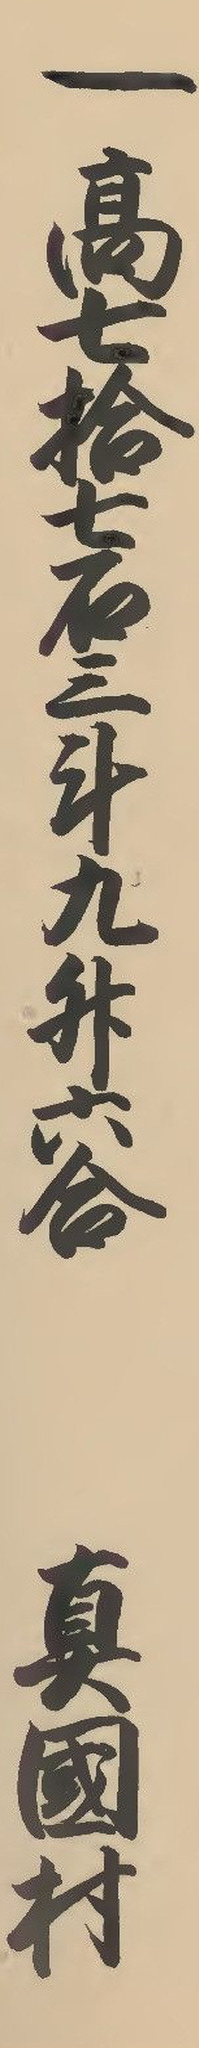一高七拾七石三斗九升六合真国村
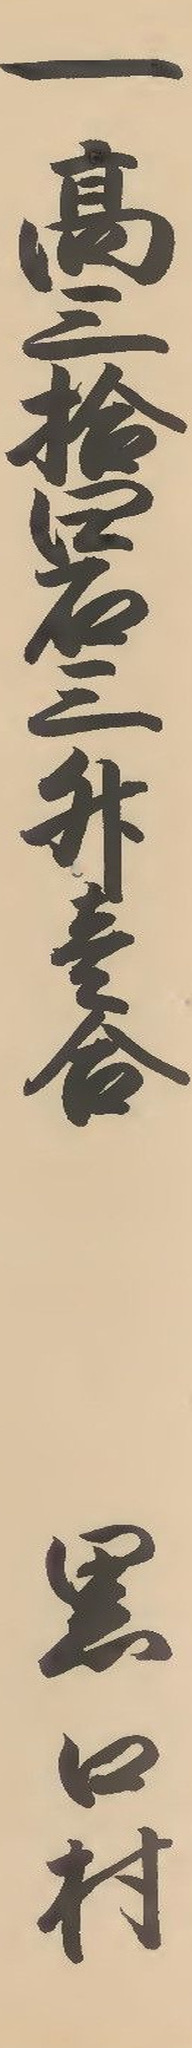一高三拾四石三升壱合黒口村
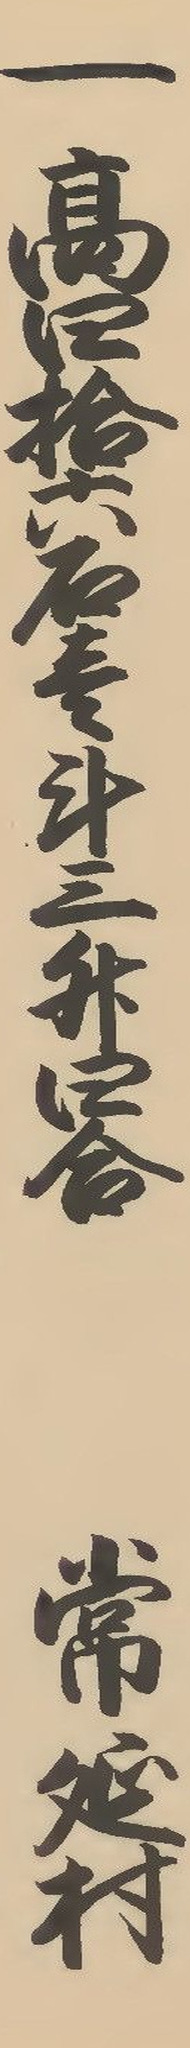一高四拾六石壱斗三升四合常延村
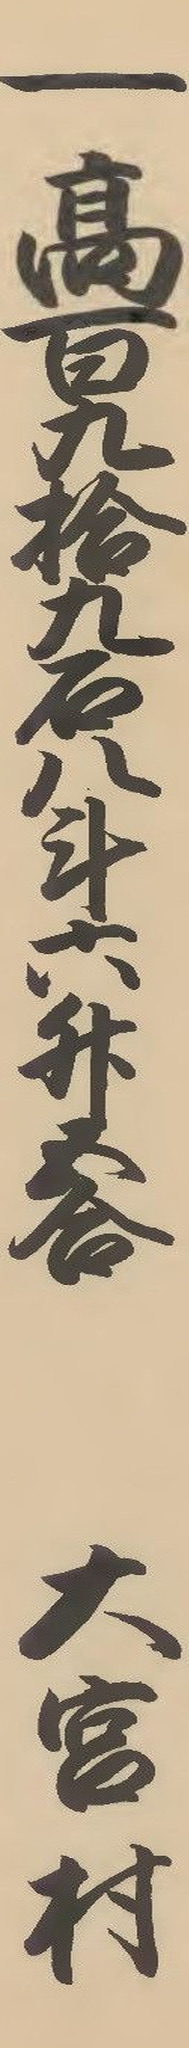一高百九拾九石八斗六升五合大宮村
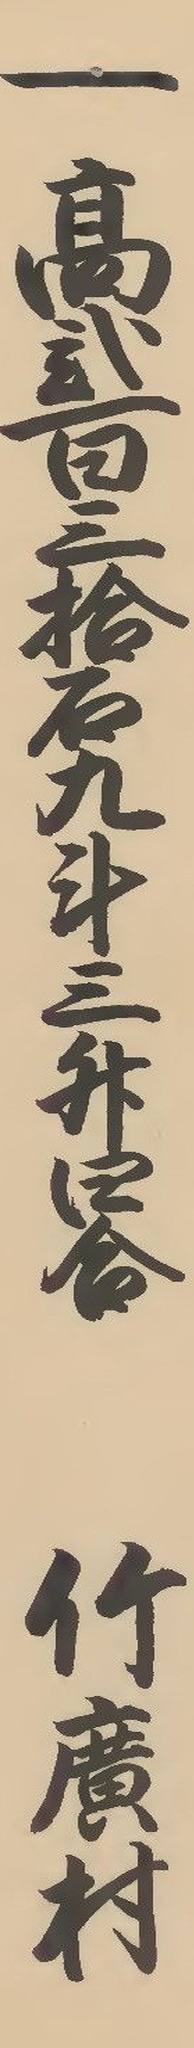一高弐百三拾石九斗三升四合竹広村

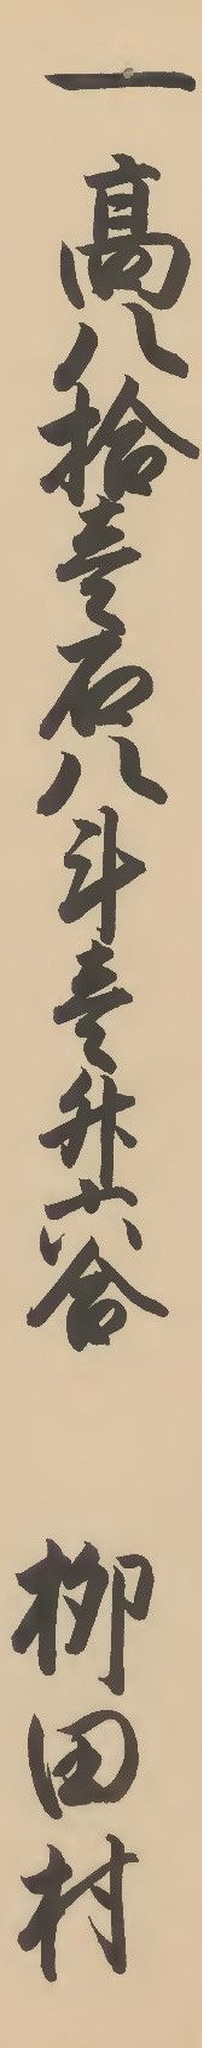一高八拾壱石八斗壱升六合柳田村
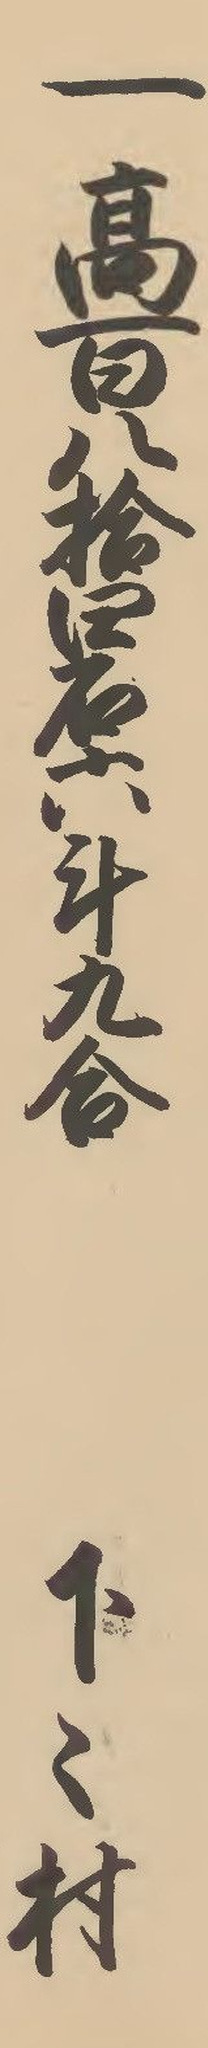一高百八拾四石六斗九合下々村
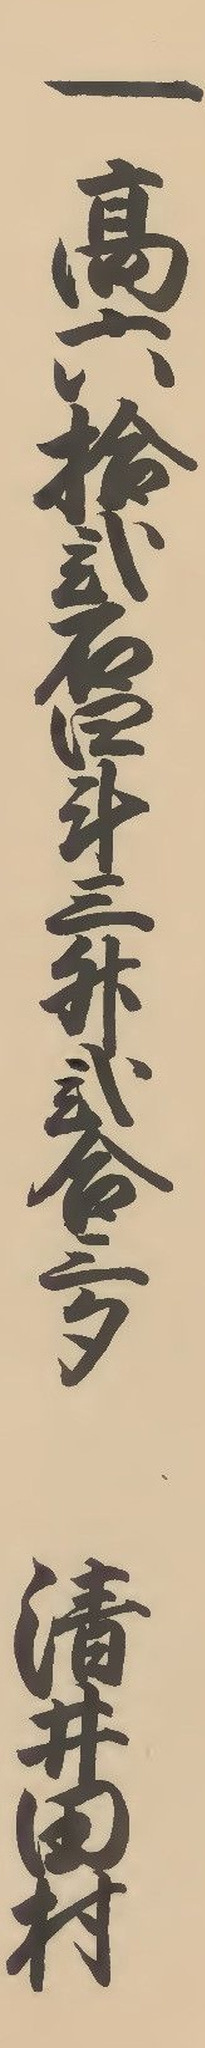一高六拾弐石四斗三升弐合三勺清井田村
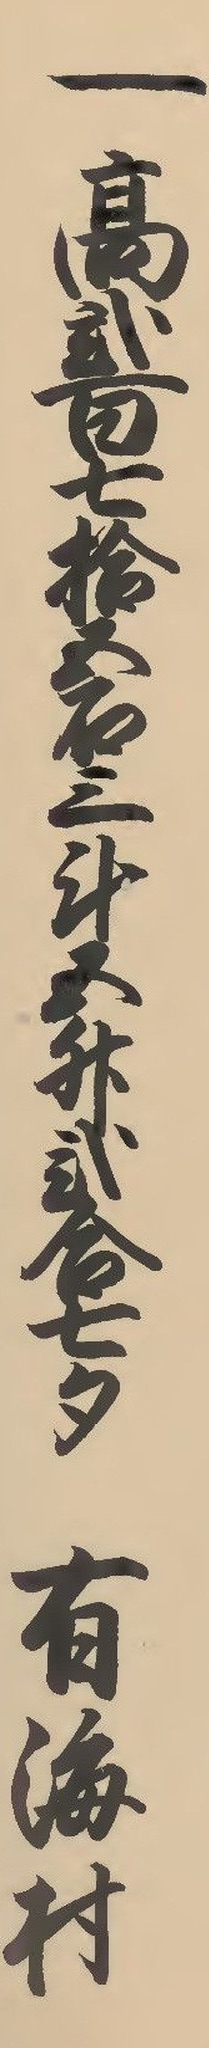一高弐百七拾五石三斗五升弐合七勺有海村
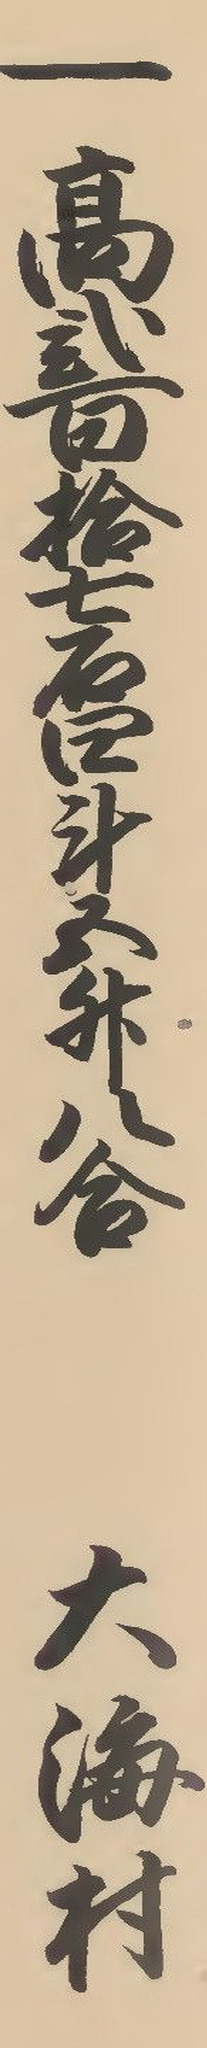一高弐百拾七石四斗五升八合大海村
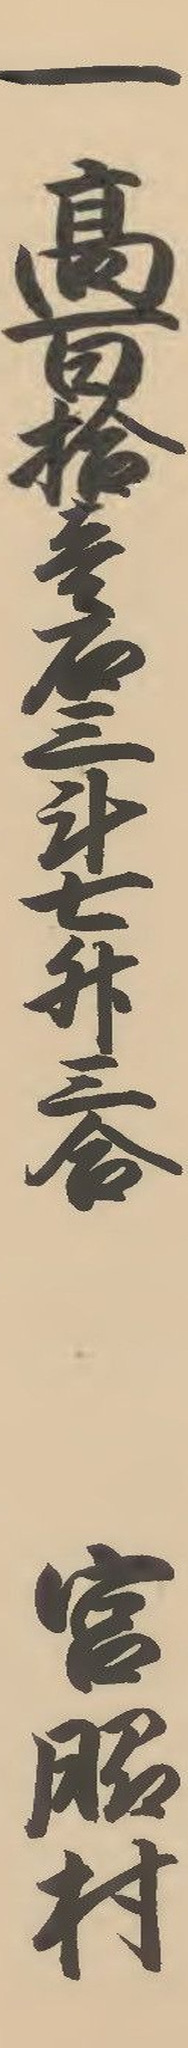一高百拾壱石三斗七升三合宮脇村
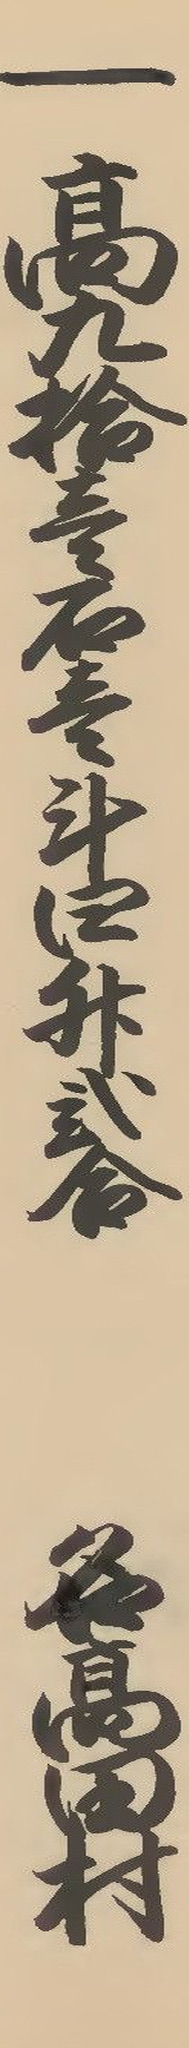一高九拾壱石壱斗四升弐合名高田村
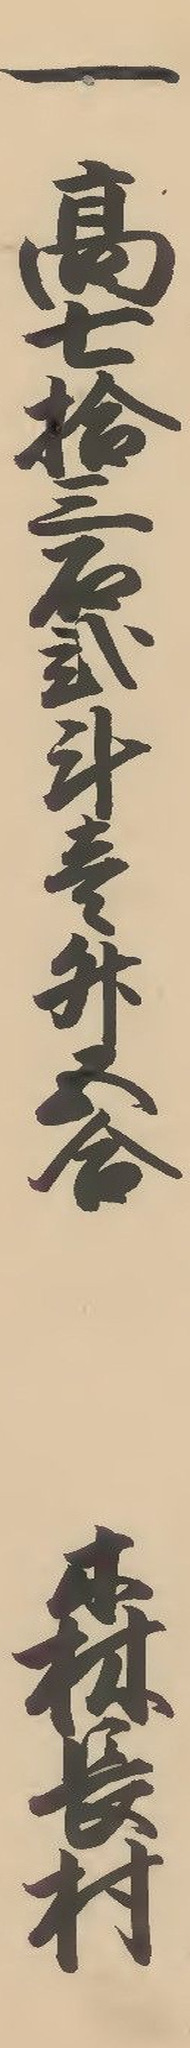一高七拾三石弐斗壱升五合森長村

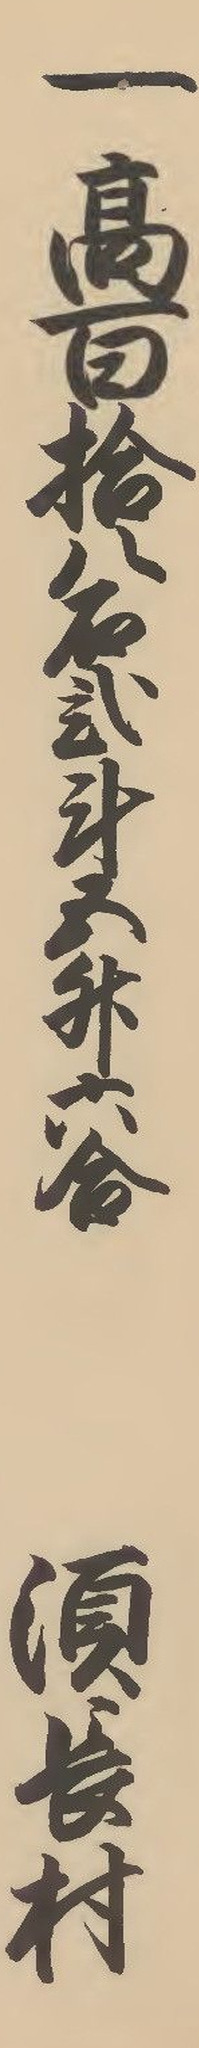一高百拾八石弐斗五升六合須長村
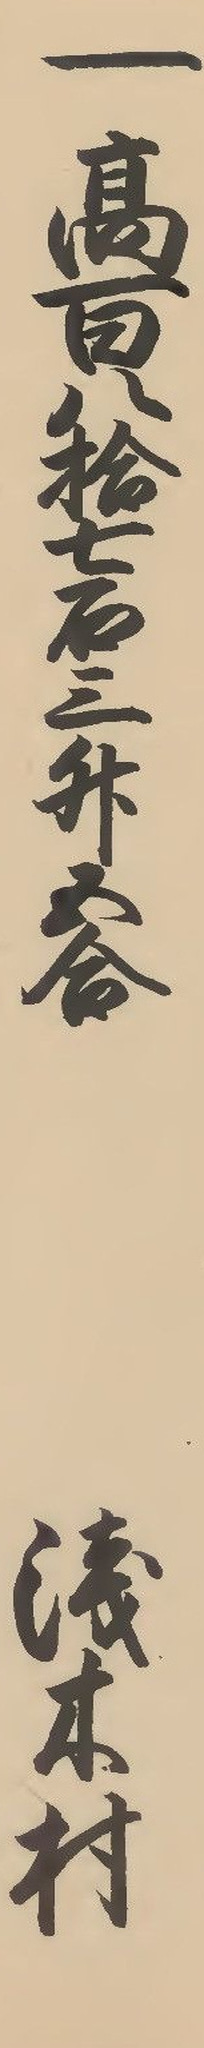一高百八拾七石三升五合浅木村
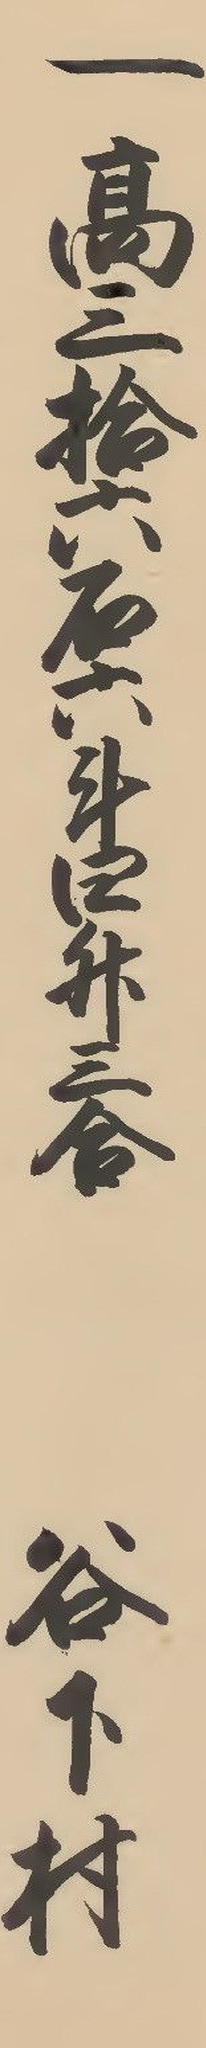一高三拾六石六斗四升三合谷下村
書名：三河国郷帳
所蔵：国立公文書館 National Archives of Japan
